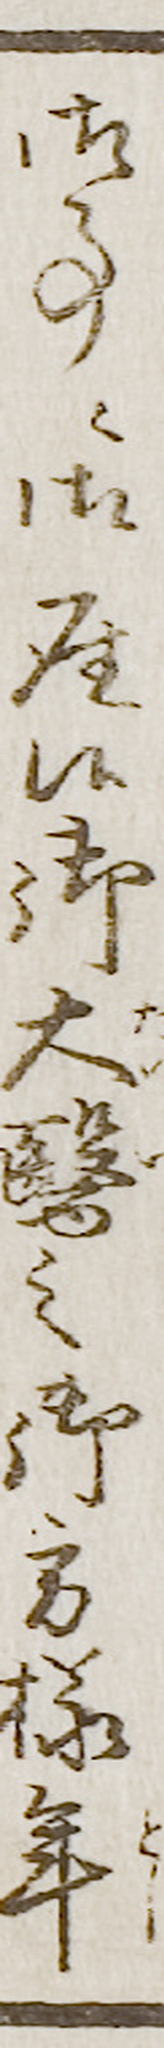御事ニ御座候御大醫之御方様年
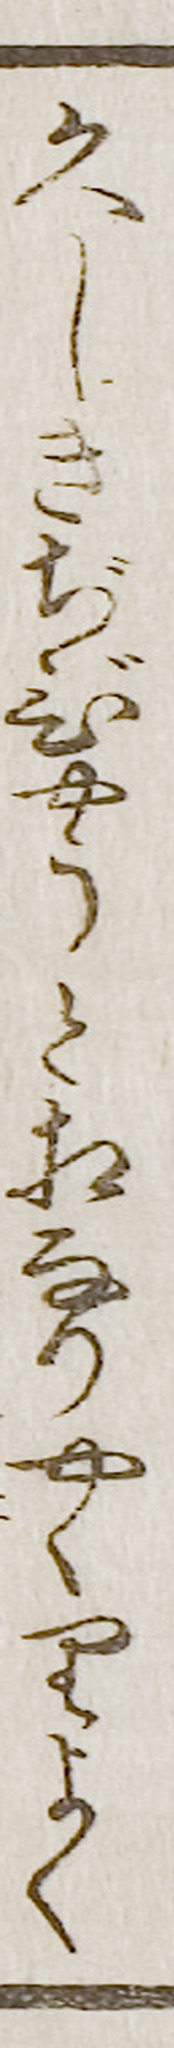久しきぢびやうと相なりやくりよく
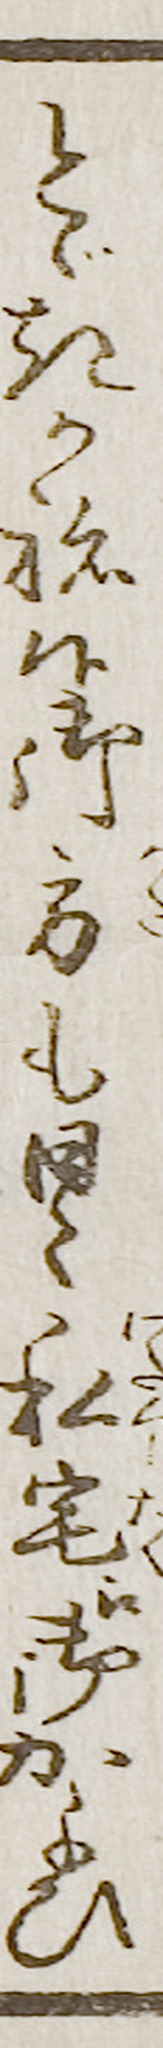とゞきかね候御方も日〻私宅え御かよひ
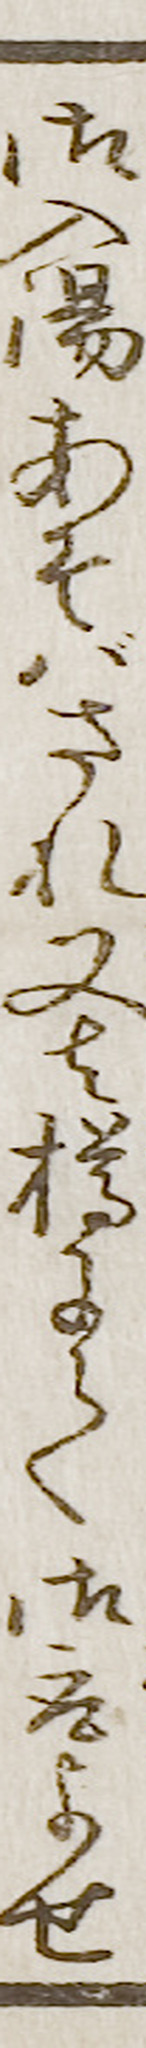御入湯あそバされ又は樽にて御取よせ
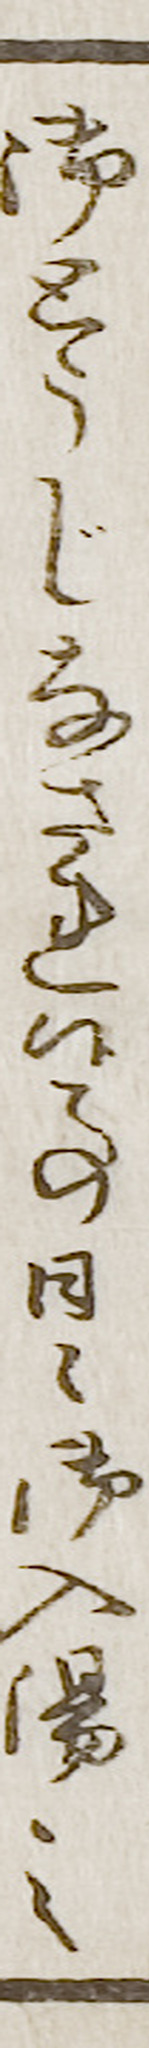御とうじなされ候事日〻御入湯之
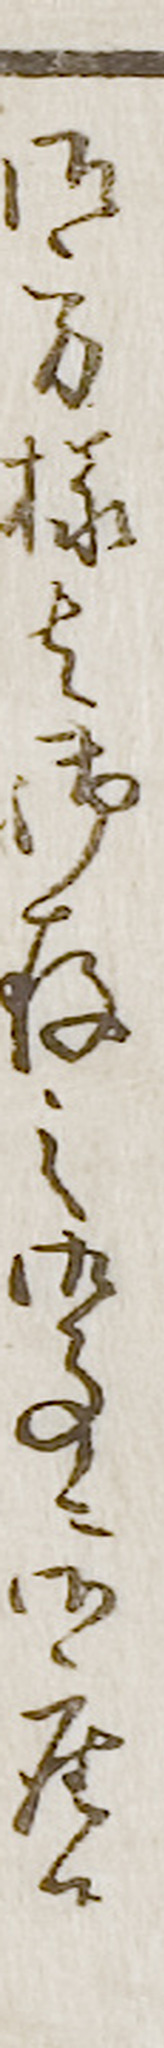御方様之御存之御事ニ御座候
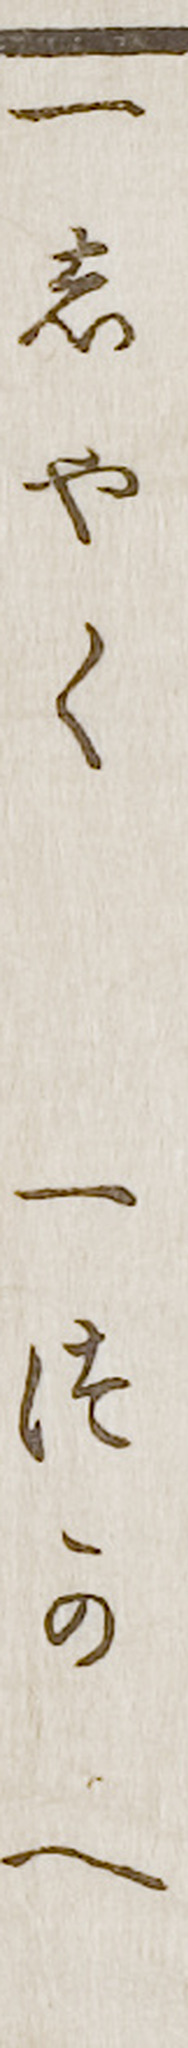一しやく一つかへ
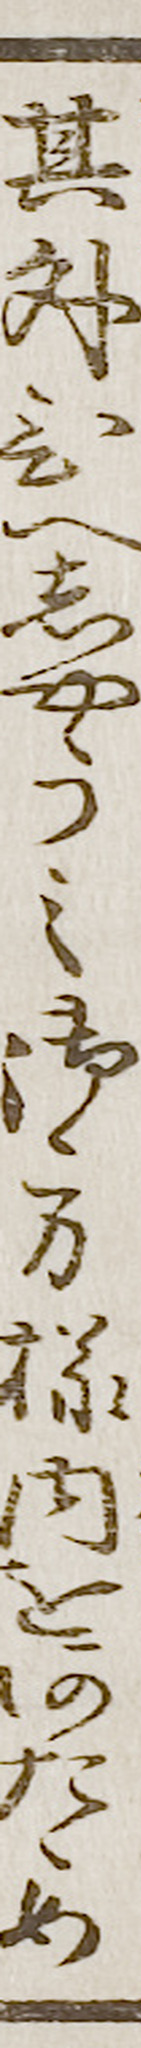其外ひへしやう之御方様内をあたゝめ
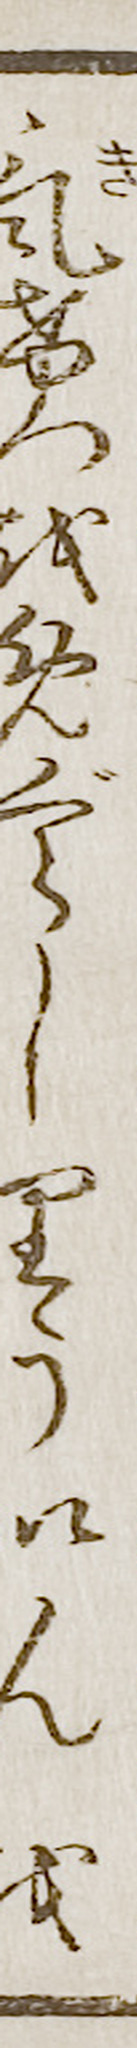氣けつをめぐらしりういんを
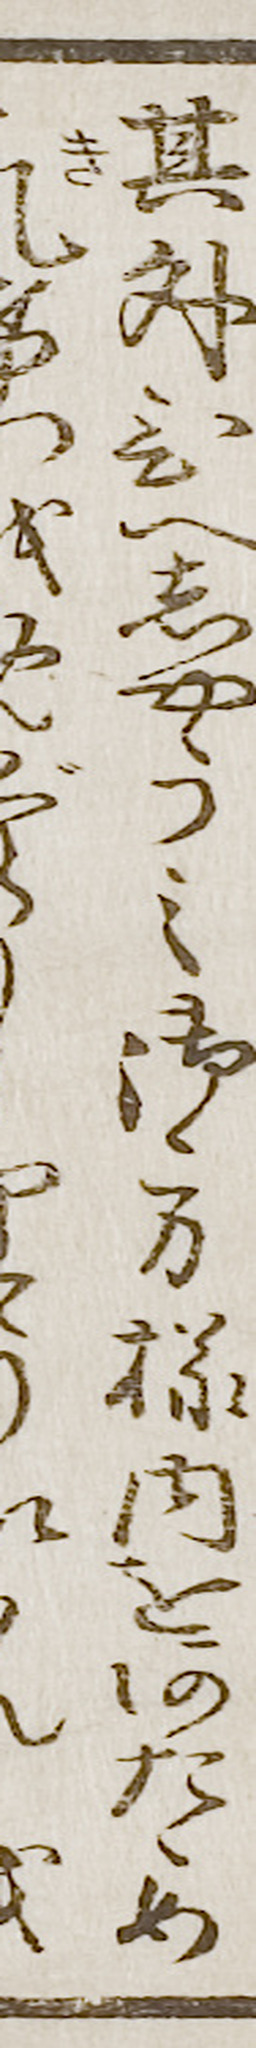氣けつをめぐらしりういんを
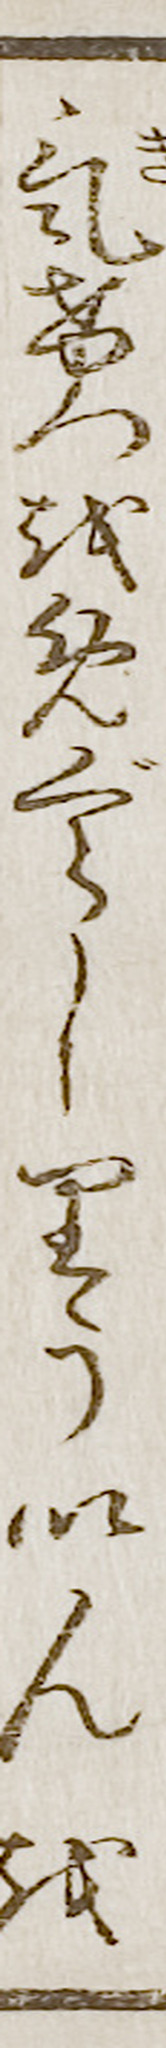氣けつをめぐらしりういんを
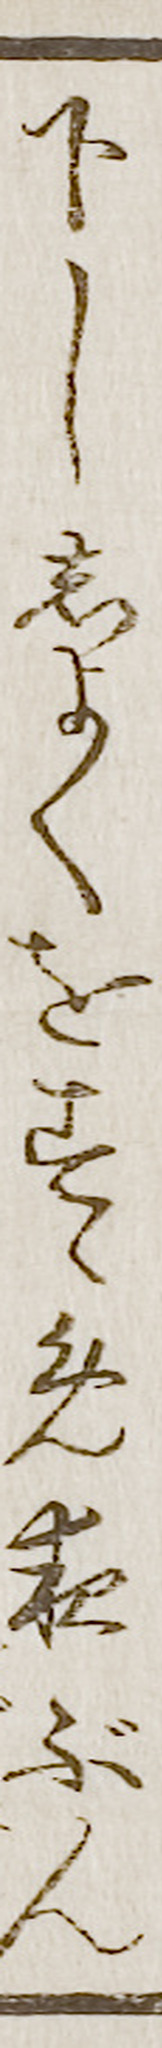下ししよくをすゝめ夜ぶん
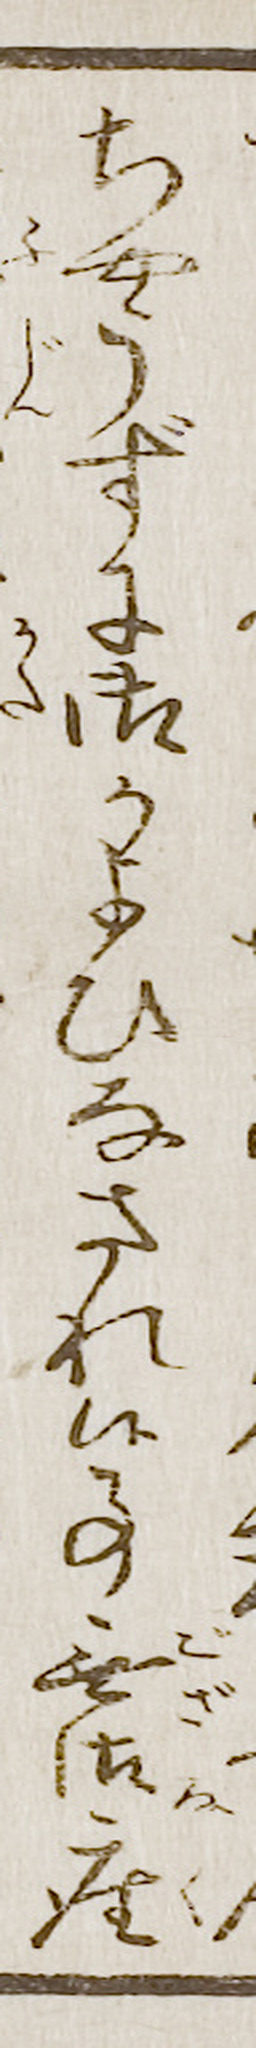ちやうずに御かよひなされ候事無御座
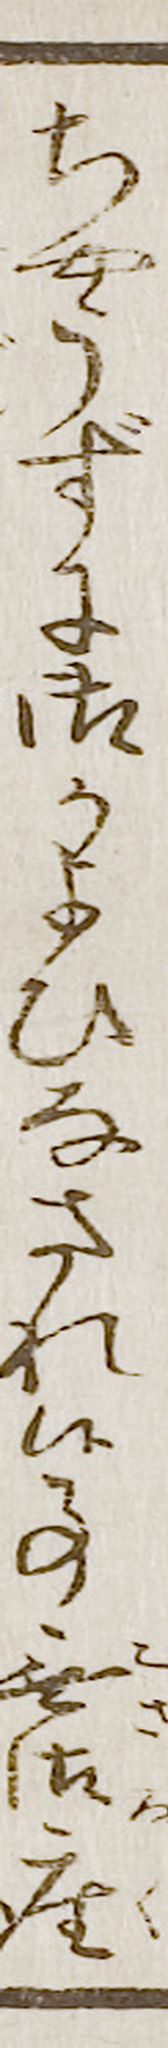ちやうずに御かよひなされ候事無御座
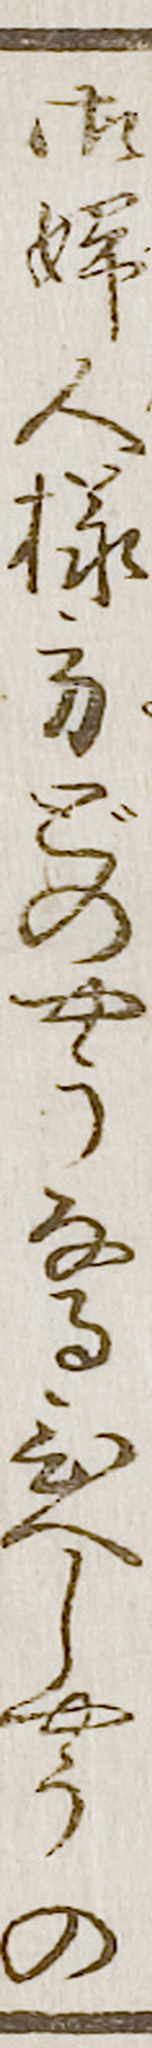御婦人様方どのやうなるひへしやうの
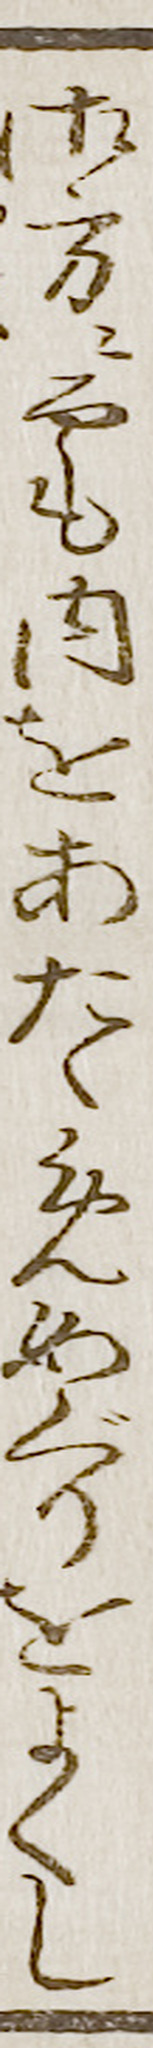御方ニ而もうちをあたゝめめぐりをよくし
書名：[豆州熱海温泉引札]
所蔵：東京大学総合図書館 General Library in the University of Tokyo, JAPAN
